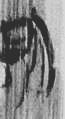則
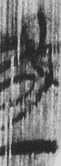或（又）
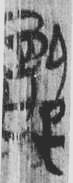○（始）
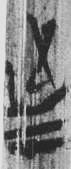至
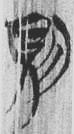則
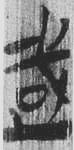或（又）
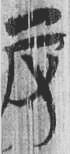反
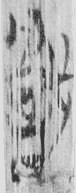○（察）
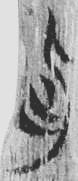此
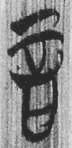言
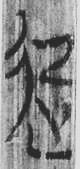○（起）
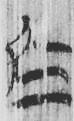於
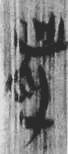○（一）
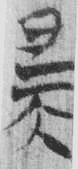耑（端）
